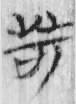苛
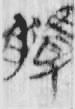○（瘥）
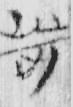苛
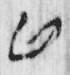㠯（以）
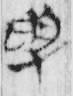受
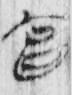宣
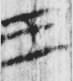王
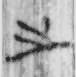之
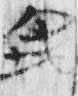○（坉）
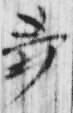市
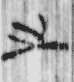之
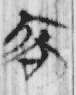客
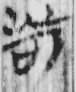苛
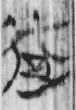适
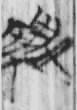執
